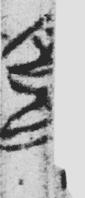○（敦）
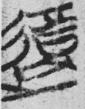○（復）
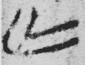亡
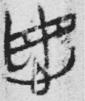悔
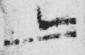上
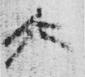六
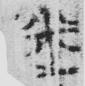迷
